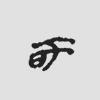吁
